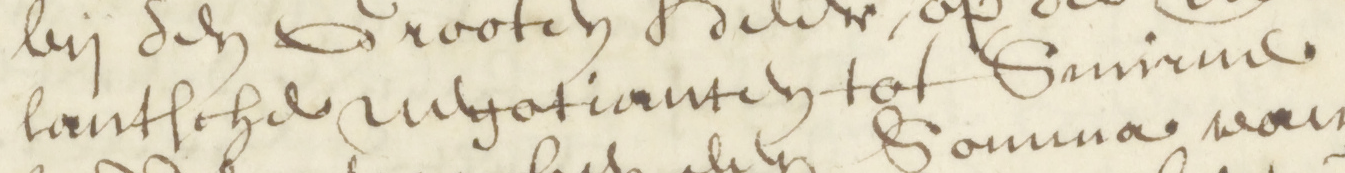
lantsche negotianten tot Smirne
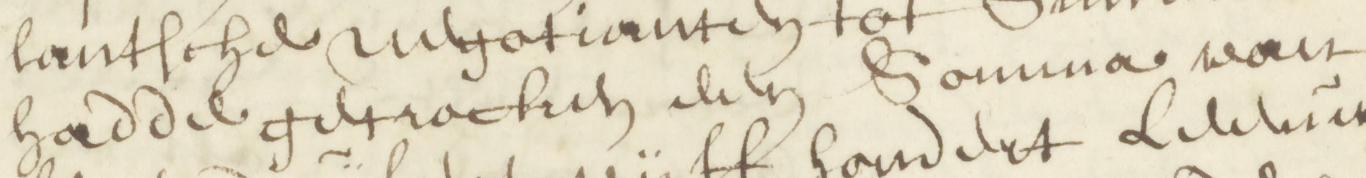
hadde getrocken een Somma van
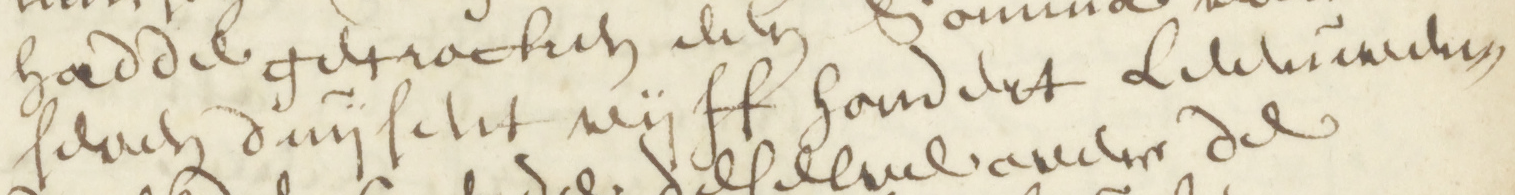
seven duijsent vijff hondert Leeuwen„
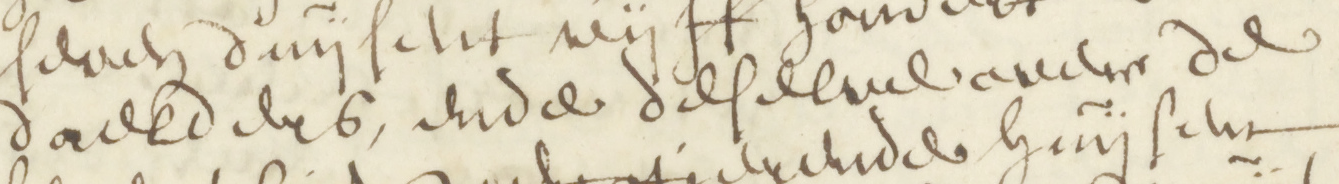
daelders, ende deselve over de
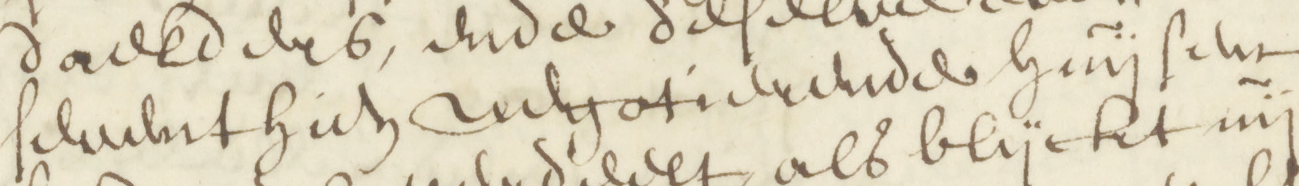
seventhien negotierende huijsen
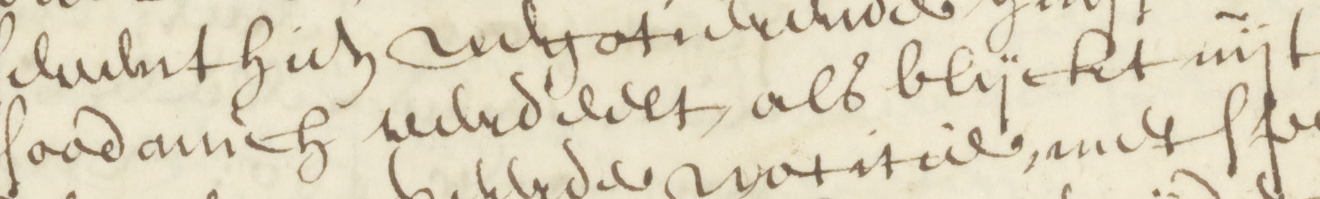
soodanich verdeelt, als blijckt uijt
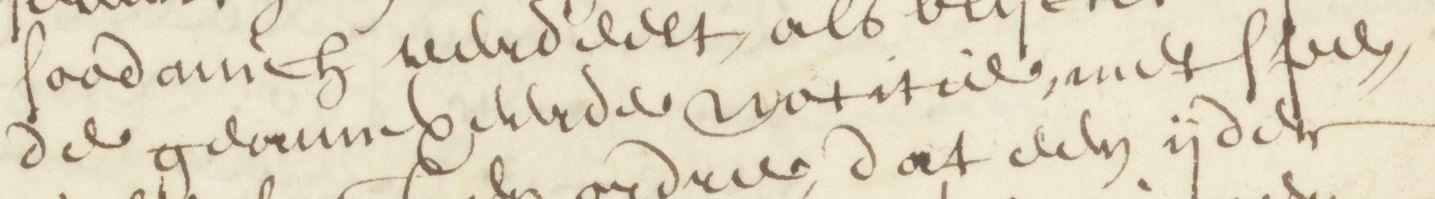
de geannexeerde notitie, met spe„
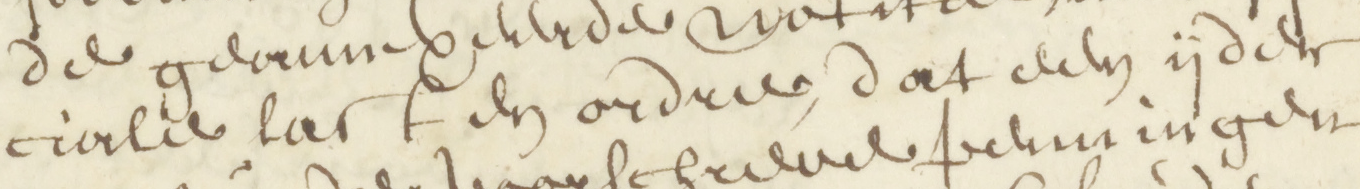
ciale last en ordre dat een ijder
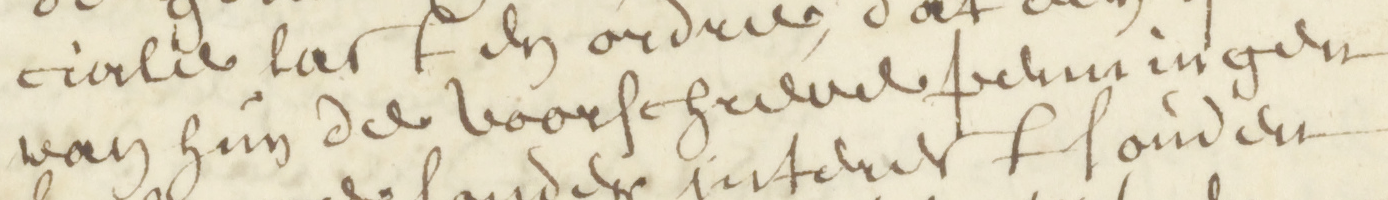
van hun de voorschreve penningen
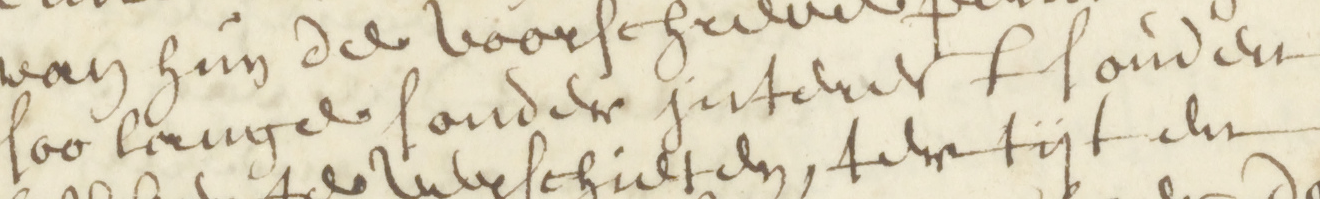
soo lange sonder interest souden
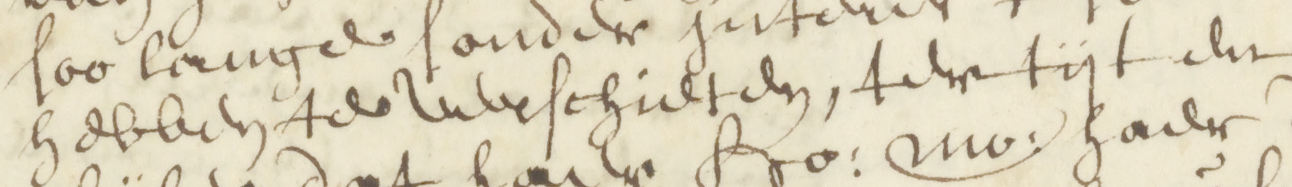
hebben te verschieten, ter tijt en
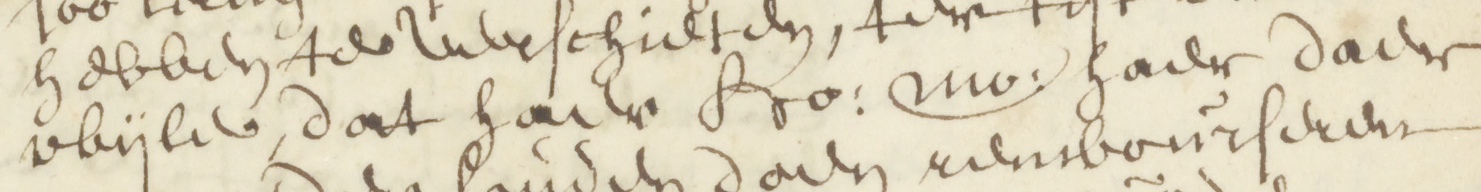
wijle, dat haer Ho:Mo: haer daer
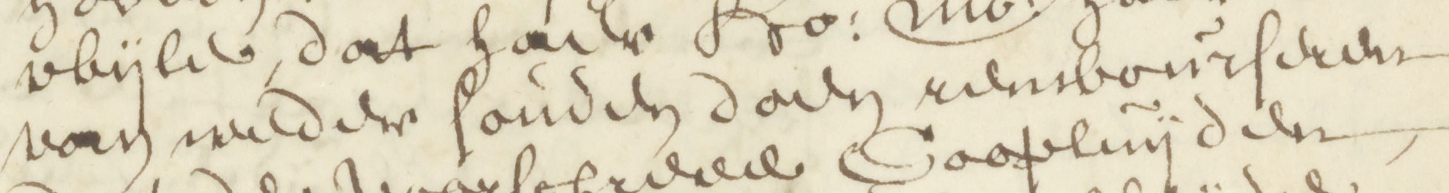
van weder souden doen rembourseren
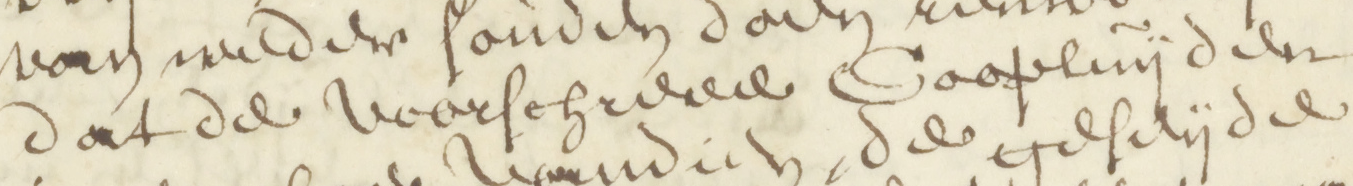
dat de voorschreve Coopluijden
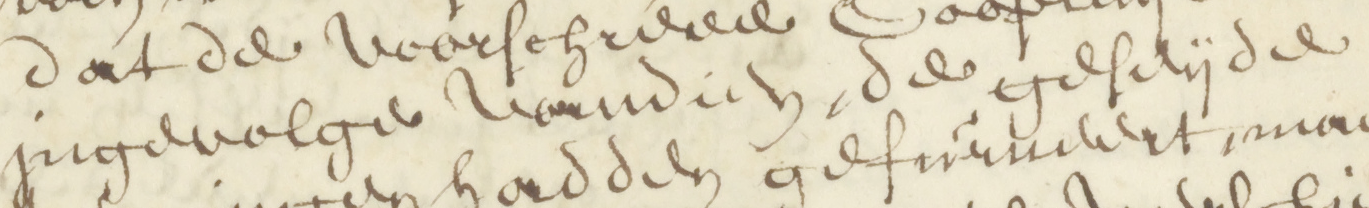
ingevolge vandien, de geseijde
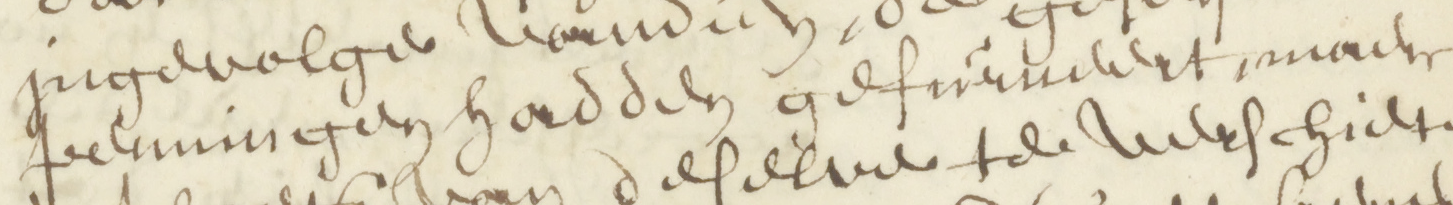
penningen hadden gefurneert, maer
